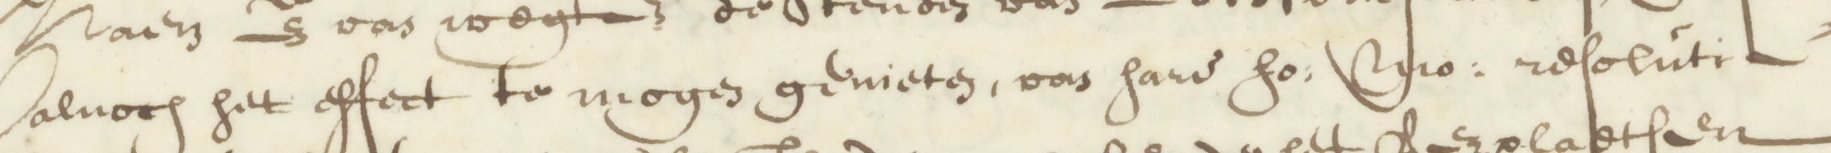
alnoch het effect te mogen genieten, van hare ho:Mo: resolutie
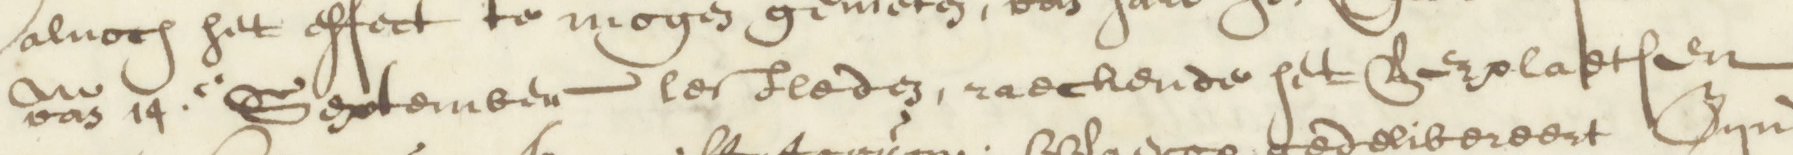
van 14e. September lestleden, raeckende het Verplaetsen
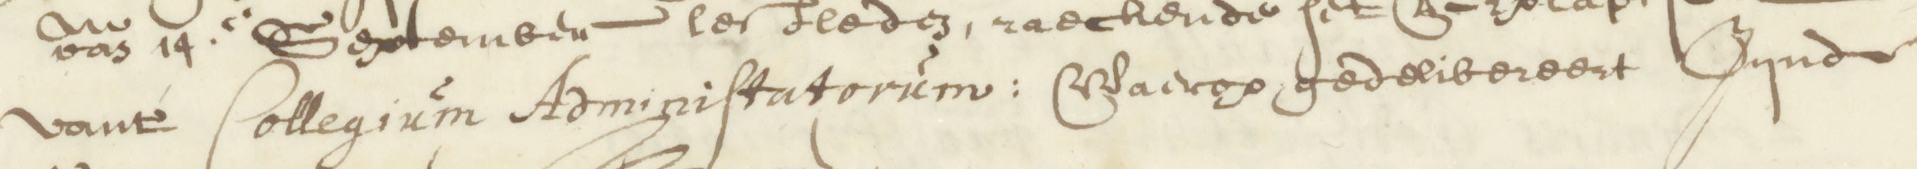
vant' Collegium Administatorum: Waerop gedelibereert Zynde
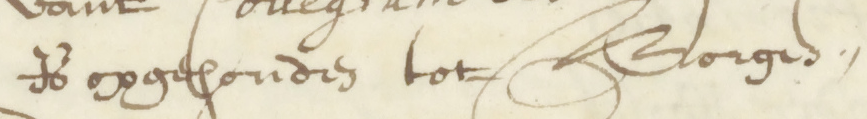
Is opgehouden tot Morgen.
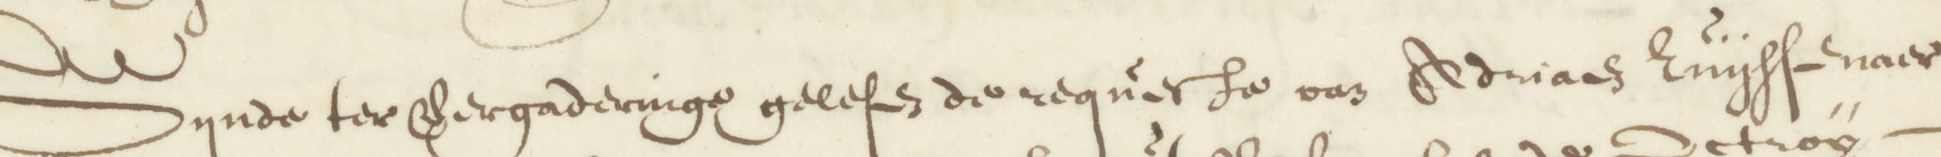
Synde ter Vergaderinge gelesen de requeste van Adriaen Ruijssenaer
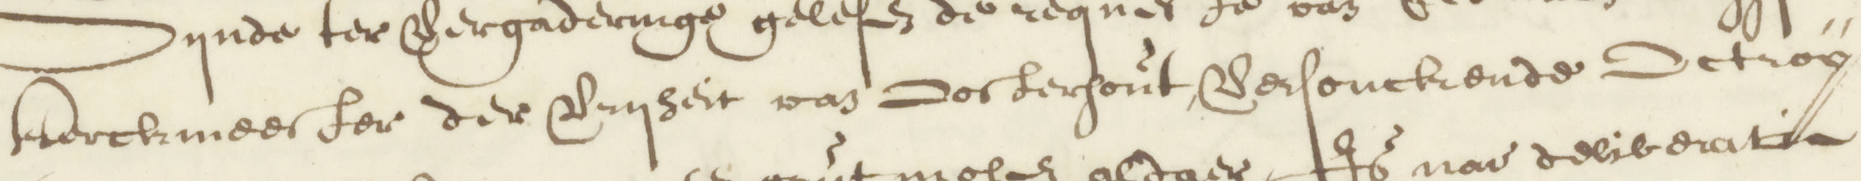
kerckmeester der Vryheit van Oosterhout, Versouckende Octroij
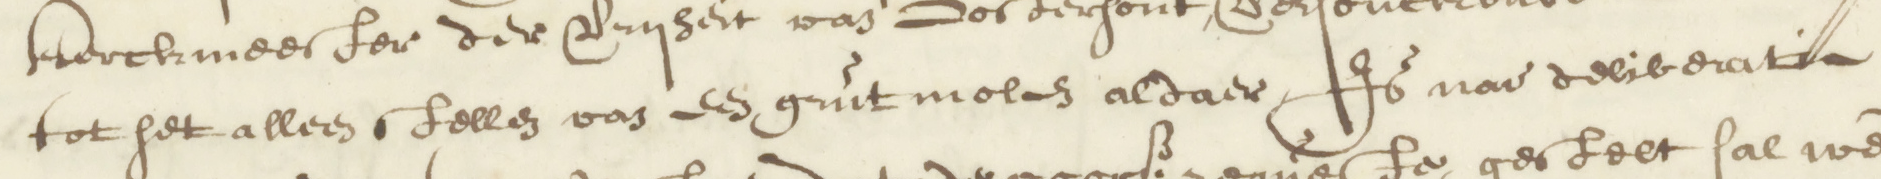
tot het alleen stellen van een grutmolen aldaer. Is nae deliberatie
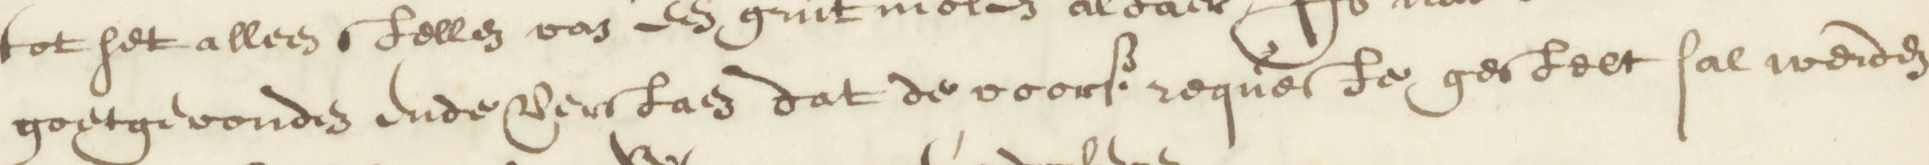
goetgevonden ende Verstaen dat de voors. requeste gestelt sal werden
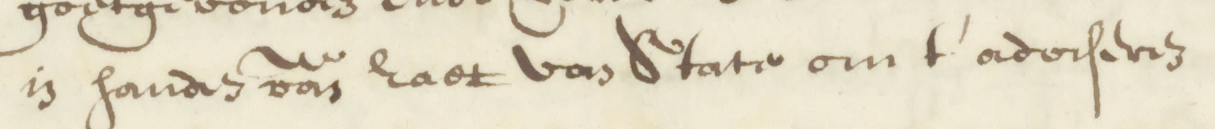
in handen van Raet van State om t‛adviseren
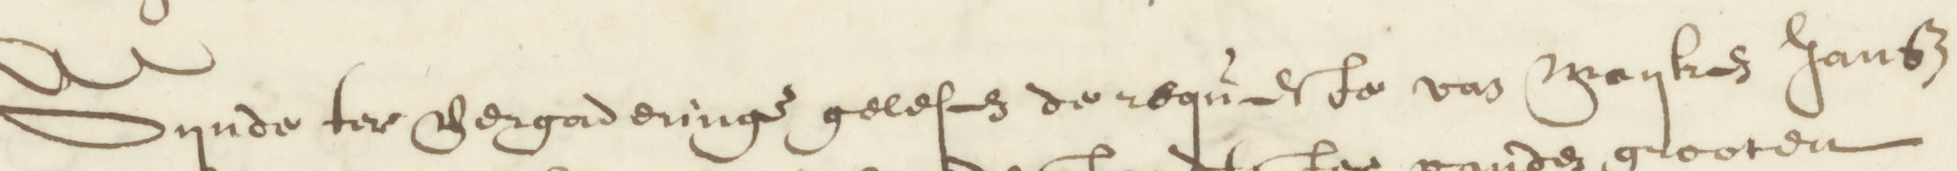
Synde ter Vergaderinge gelesen de requeste van Mayken Jansz
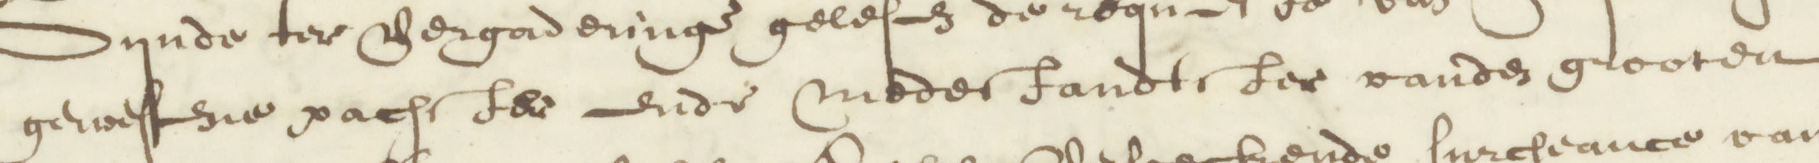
gewesene pachster ende medestandtster vanden grooten
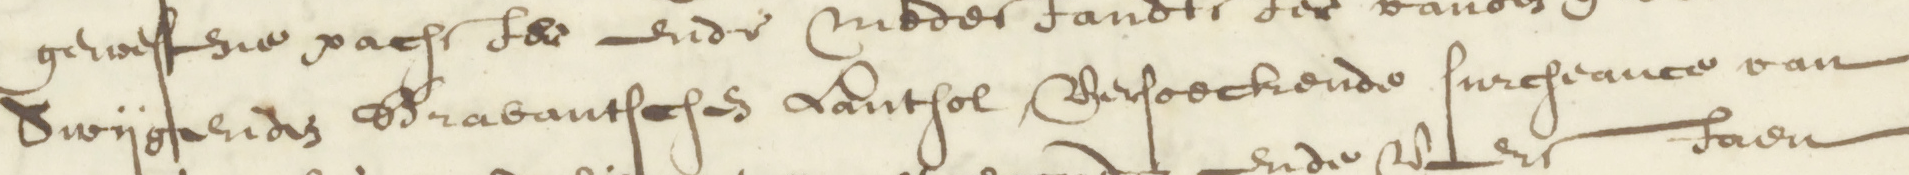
Swijgenden Brabantschen Lanthol, Versoeckende surcheance van
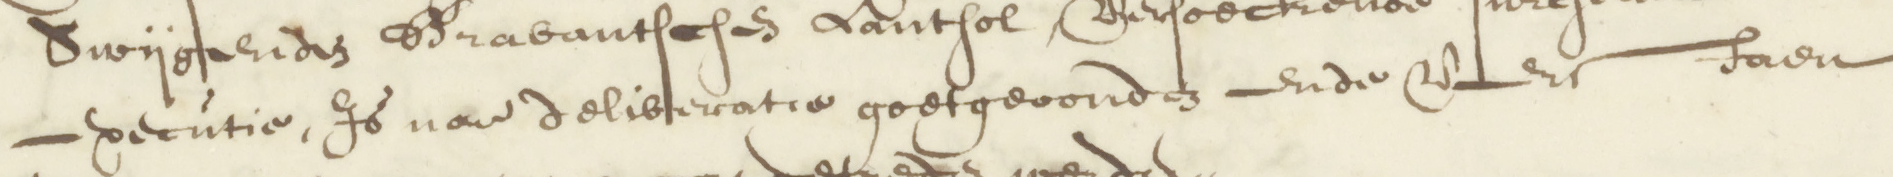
executie. Is nae deliberatie goetgevonden ende Verstaen
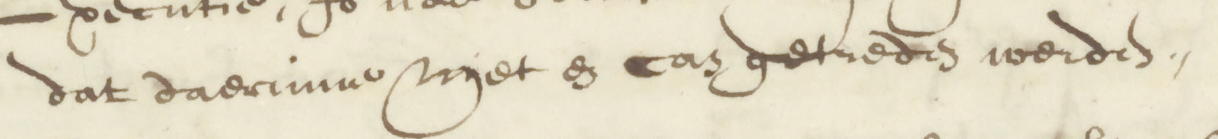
dat daerinne niet en can getreden werden.
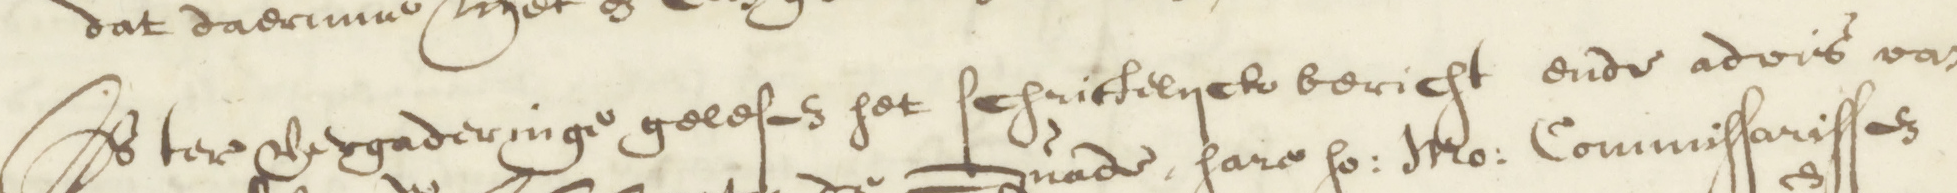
Is ter Vergaderinge gelesen het schriftelyck bericht ende advis van
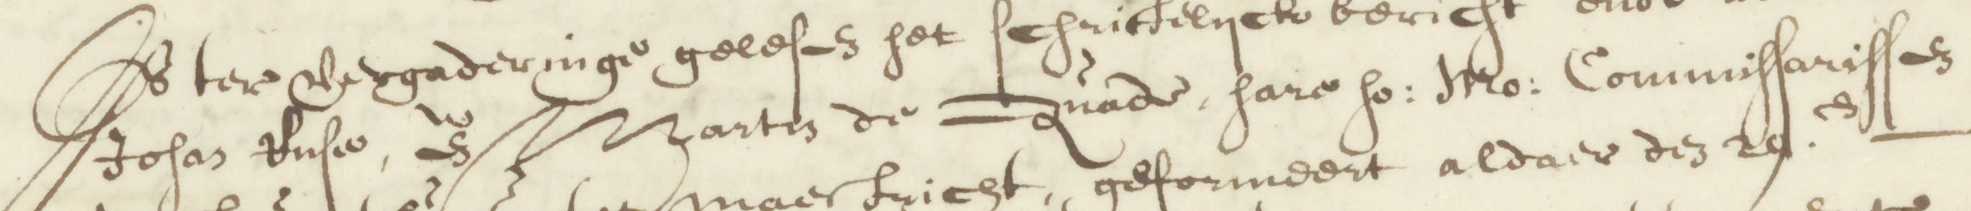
Johan Ruse en Marten de Quade, hare ho:Mo: Commissarissen
